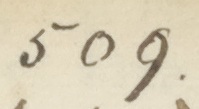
509
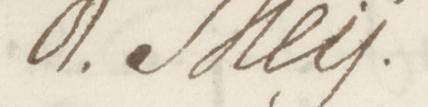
8 Meij
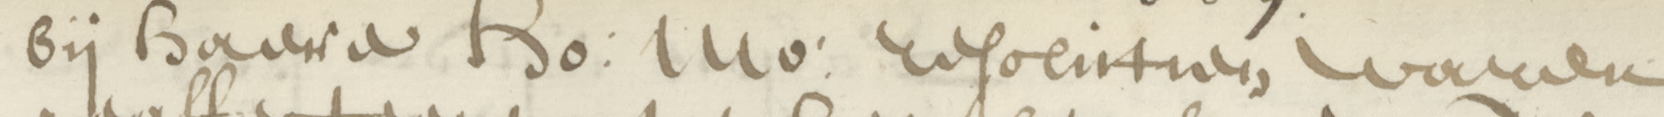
bij haere Ho:Mo: resolutien waren
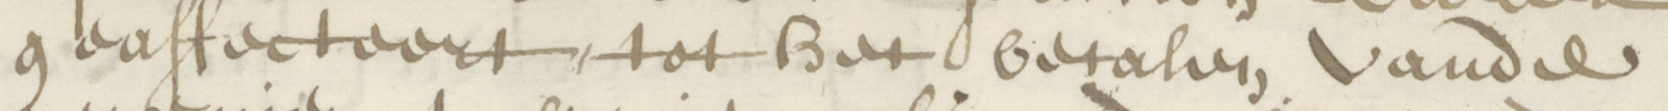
geaffecteert tot het betalen vande
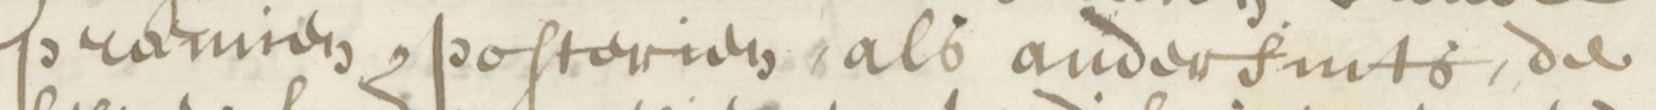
præmien, posterien als andersints, de
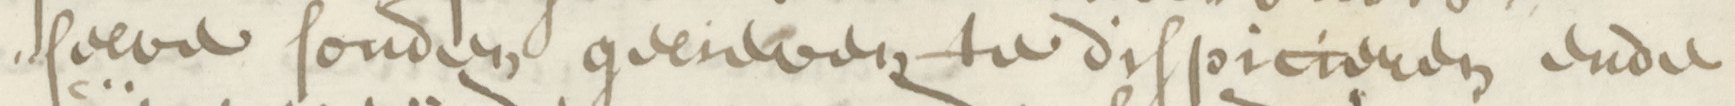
selve souden gelieven te dispicieren ende
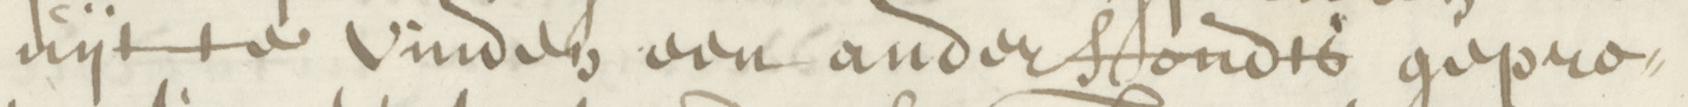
uijt te vinden een ander fondts gepro„
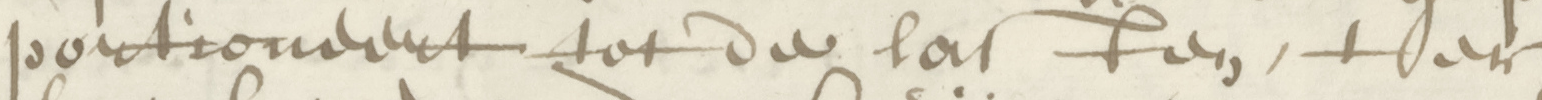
portioneert tot de lasten, ter
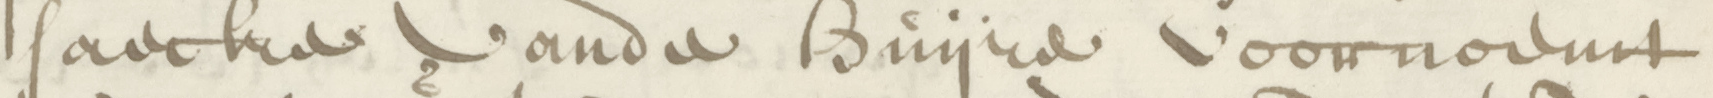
saecke vande huijre voornoemt
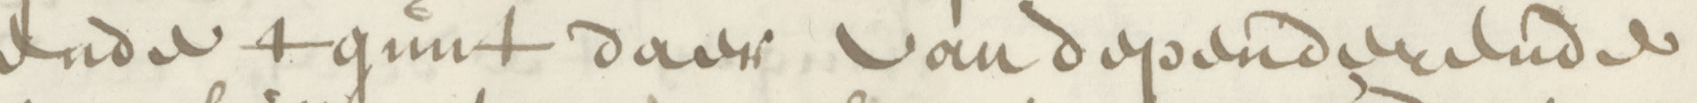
ende t gunt daer van dependerende
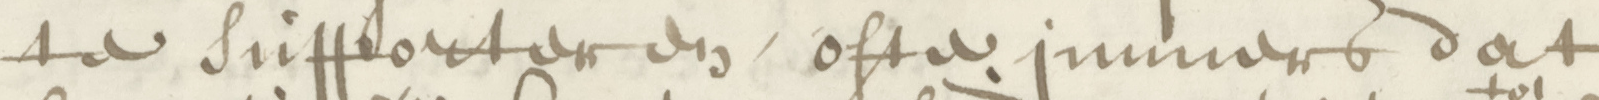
te supporteren, ofte immers dat
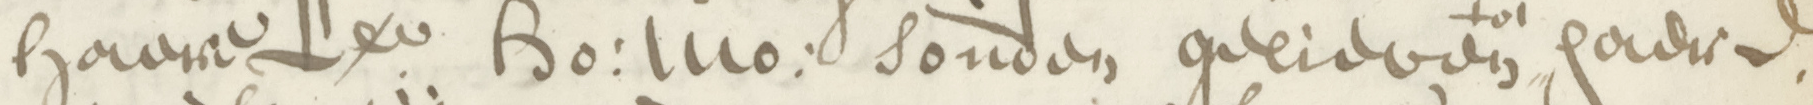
haere E. Ho:Mo: souden gelieven tot haer E.
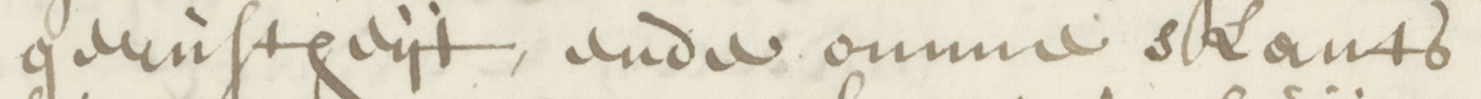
gerustheijt, ende omme s Lants —
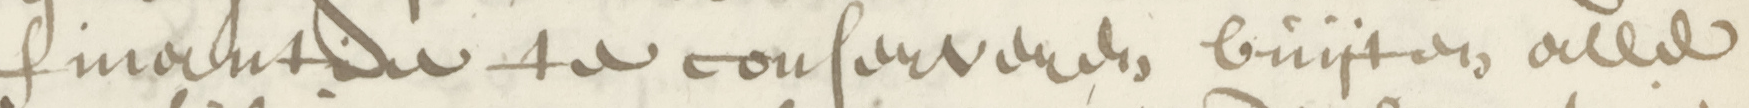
finantie te conserveren buijten alle
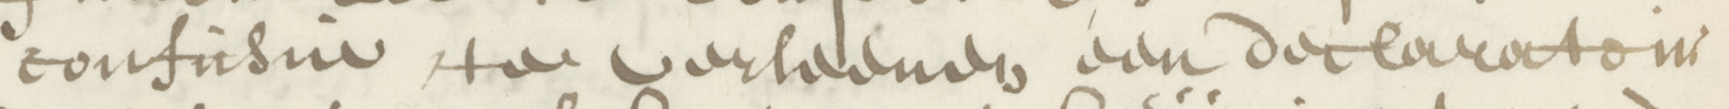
confusie te verleenen een declaratoir
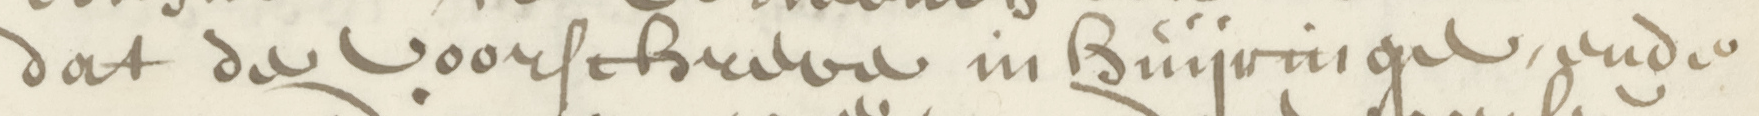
dat de voorschreve in huijringe, ende
